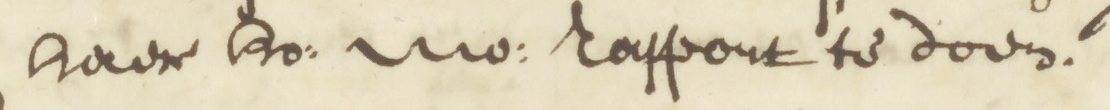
haer Ho:Mo: rapport te doen.
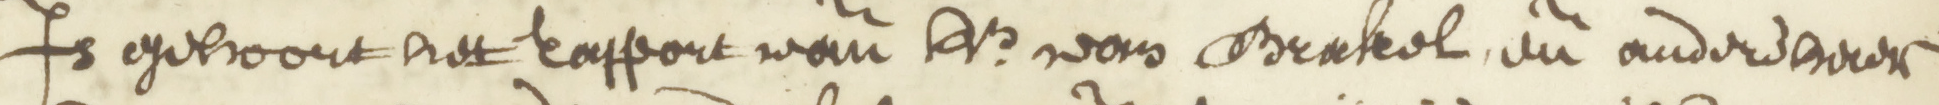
Is gehoort het rapport van Hn. van Brakel, en andere haer
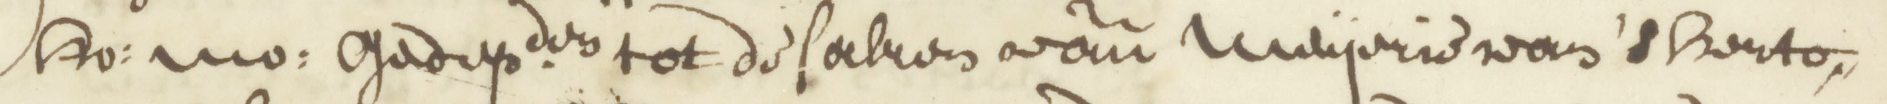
Ho:Mo: Gedepden. tot de saken van Meijerie van 'sHerto,,
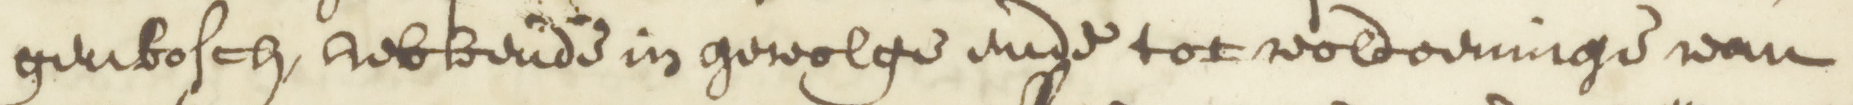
genbosch, hebbende in gevolge ende tot voldoeninge van
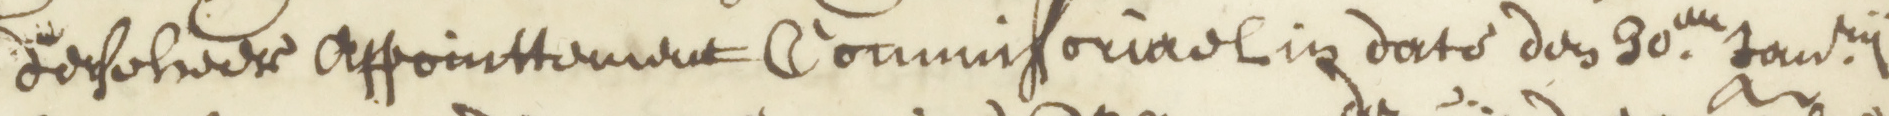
derselver Appointtement Commissoriael in date den 30en. Janrij.
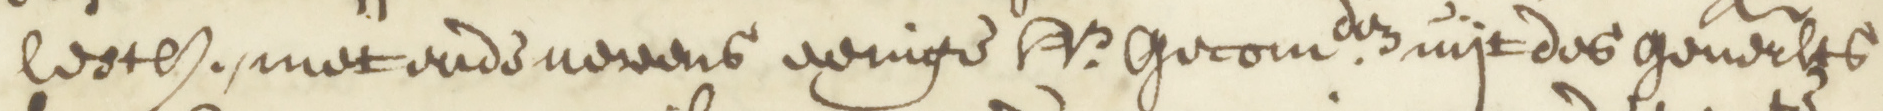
lestl. met ende nevens eenige Hn. Gecomden. uijt des generlts
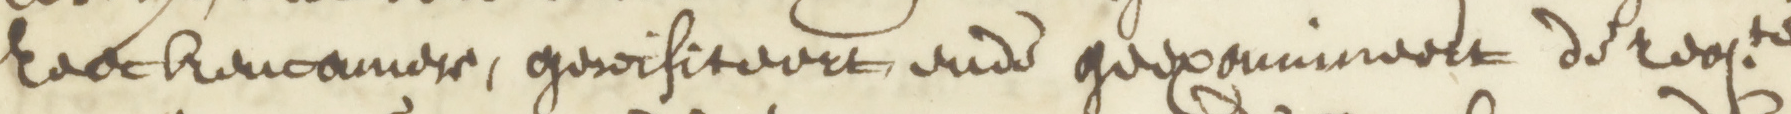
Reeckencamer, gevisiteert, ende geexamineert de reqte.
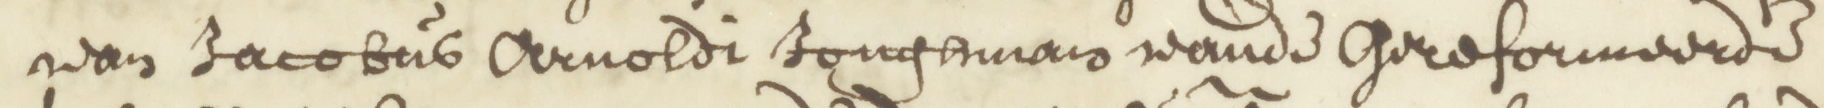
van Jacobus Arnoldi Jonghman vande Gereformeerde
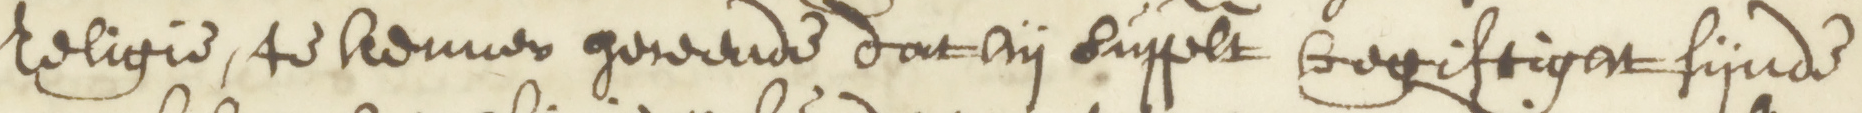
Religie, te kennen gevende dat hij Supplt begiftight sijnde
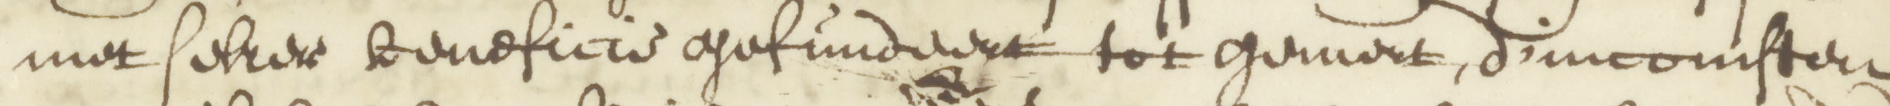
met seker beneficie gefundeert tot gemert, d‛incomsten
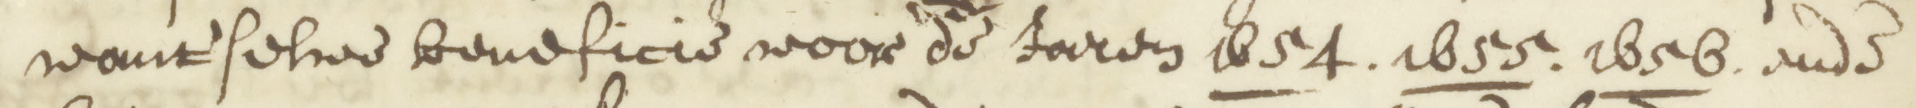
vant' selve beneficie voor de Jaren 1654. 1655. 1656 ende
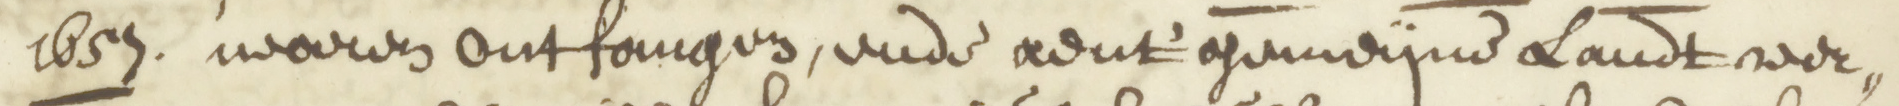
1657. waren ontfangen, ende aent' gemeijne Landt ver„
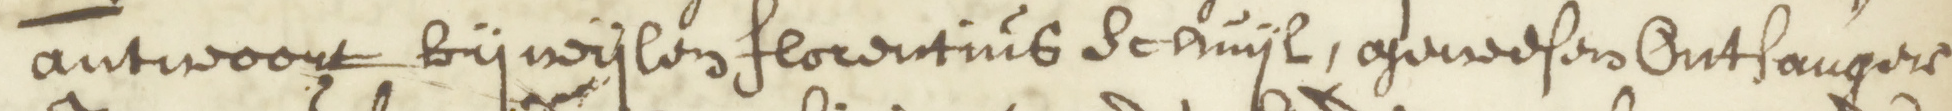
antwoort bij wijlen Florentius Schuijl, gewesen Ontfanger
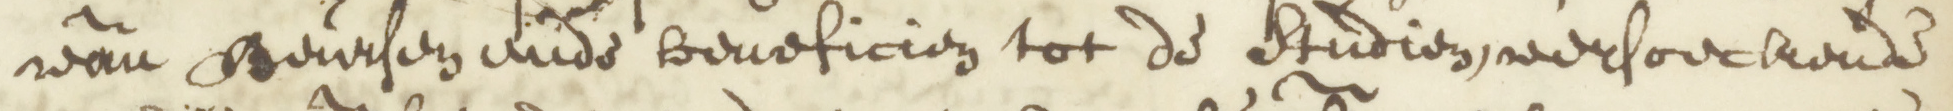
van Beursen ende beneficien tot de Studien, versoeckende
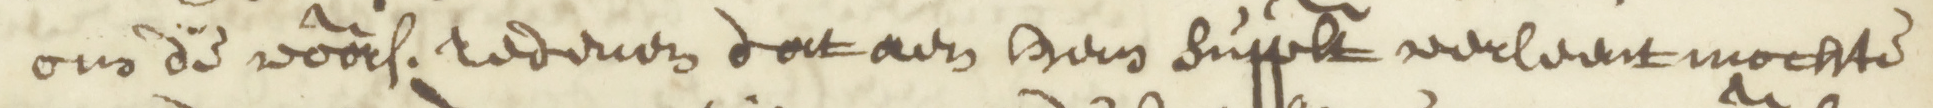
om de voors. redenen dat aen hem Supplt verleent mochte
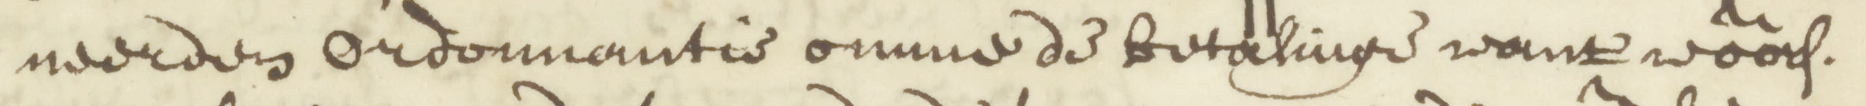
werden ordonnantie omme de betalinge vant' voors.
